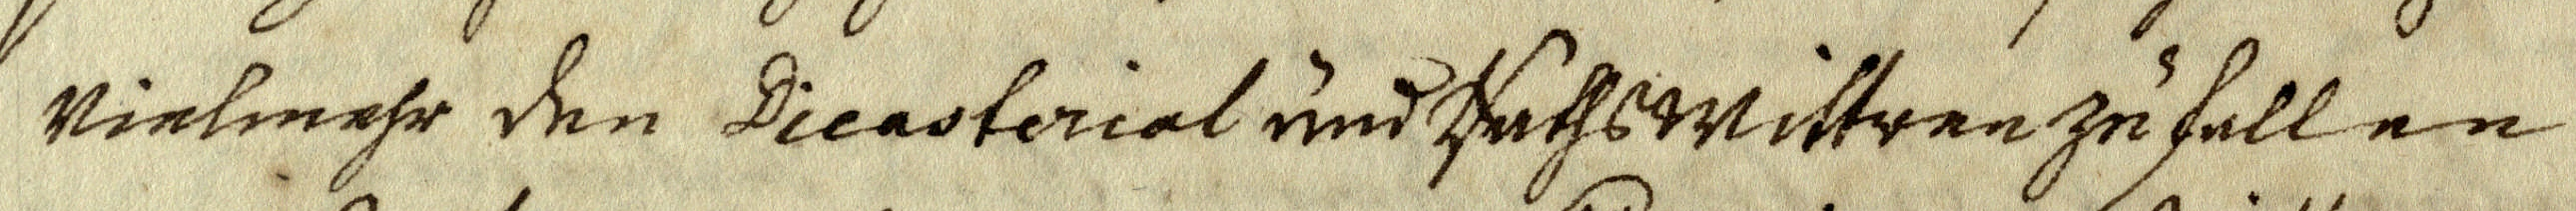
vielmehr den Dicasterial und Rathswittwen zufallen
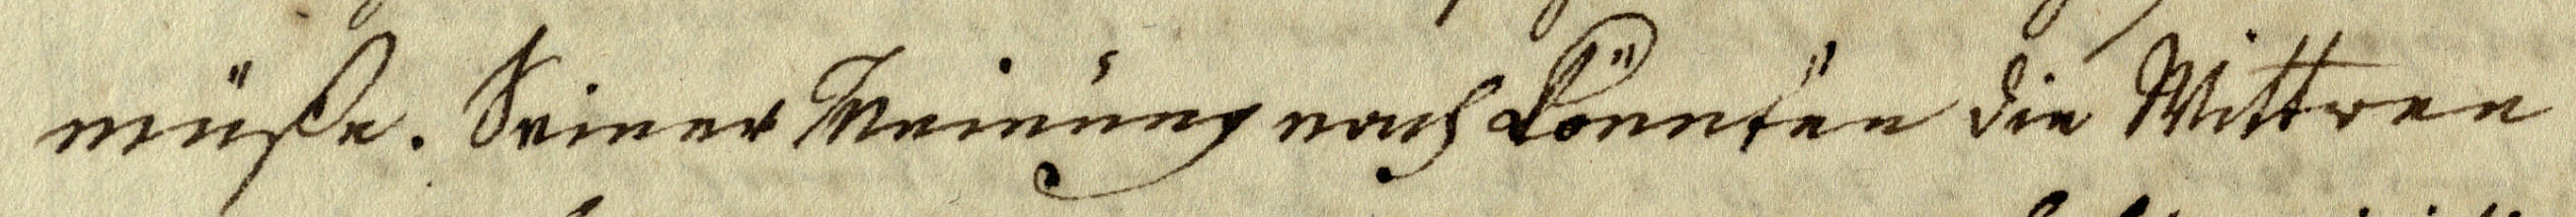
müße. Seiner Meinung nach könnten die Wittwen
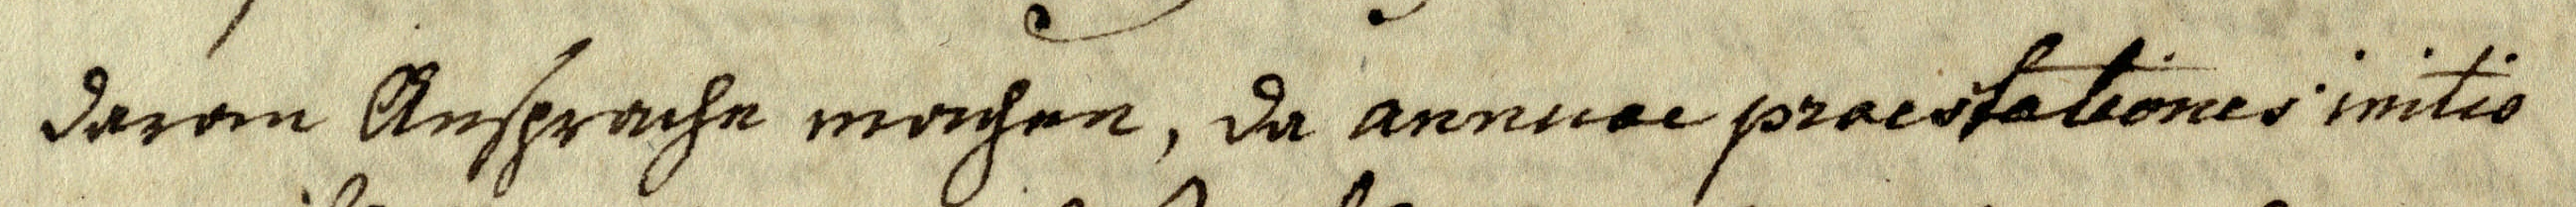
daran Ansprache machen, da annuae praestationes initio
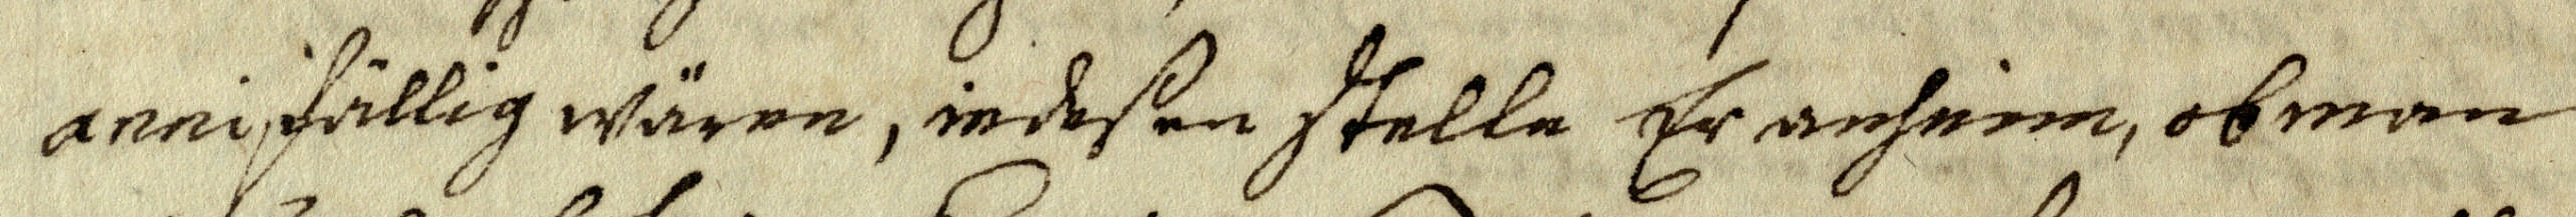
anni fällig wären, indeßen stelle Er anheim, ob man
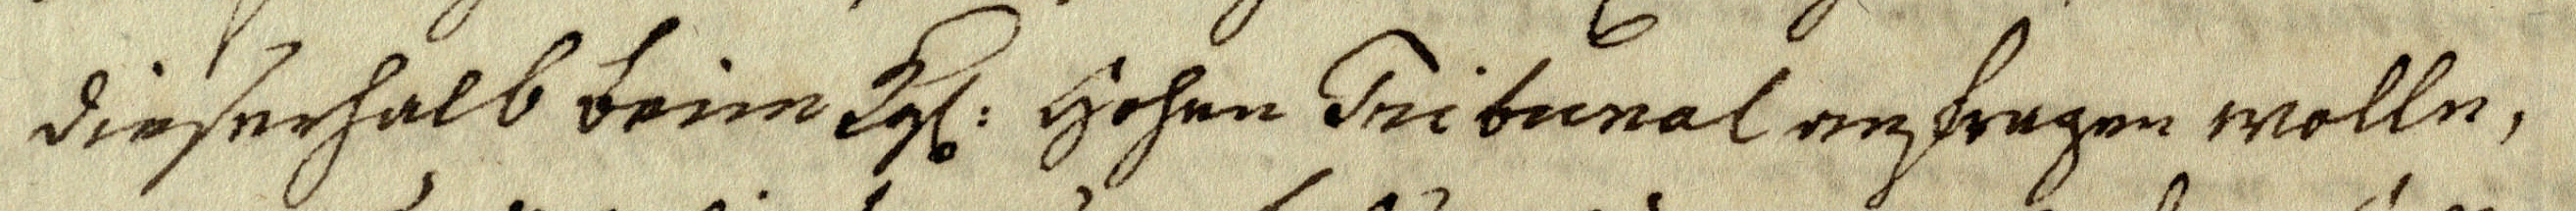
dieserhalb beim Kgl. Hohen Tribunal anfragen wolle,
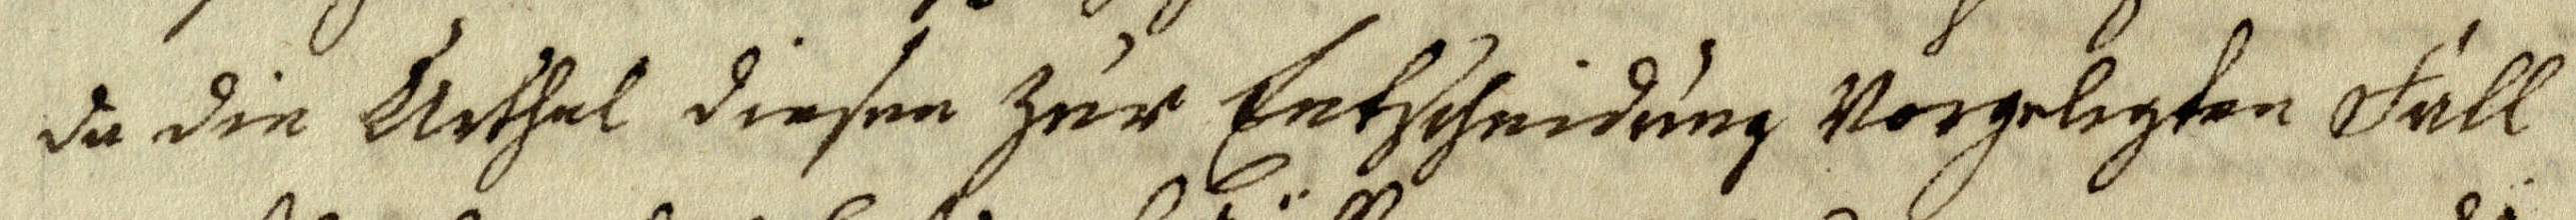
da die Urthel diesen zur Entscheidung vorgelegten Fall
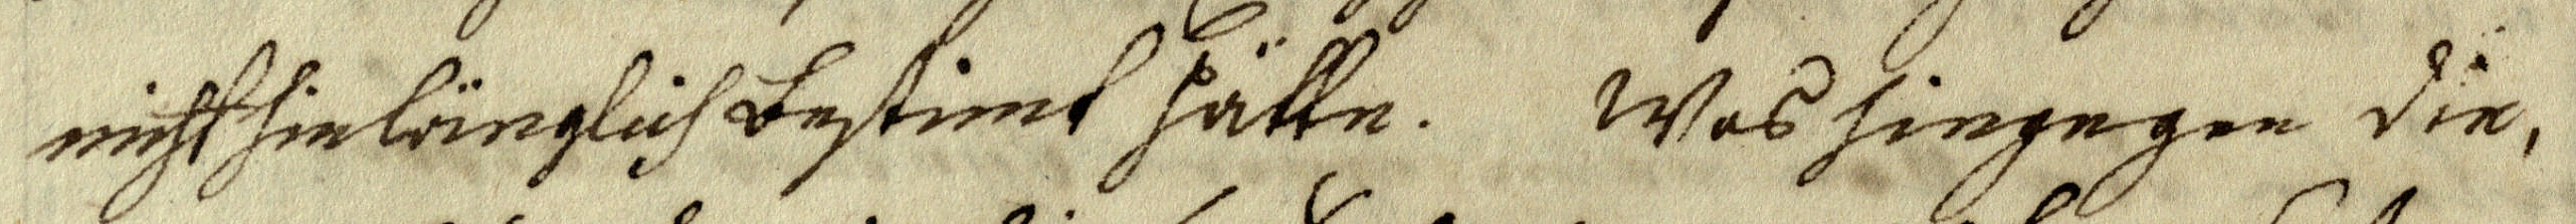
nicht hinlänglich bestimt hätte. Was hingegen die,
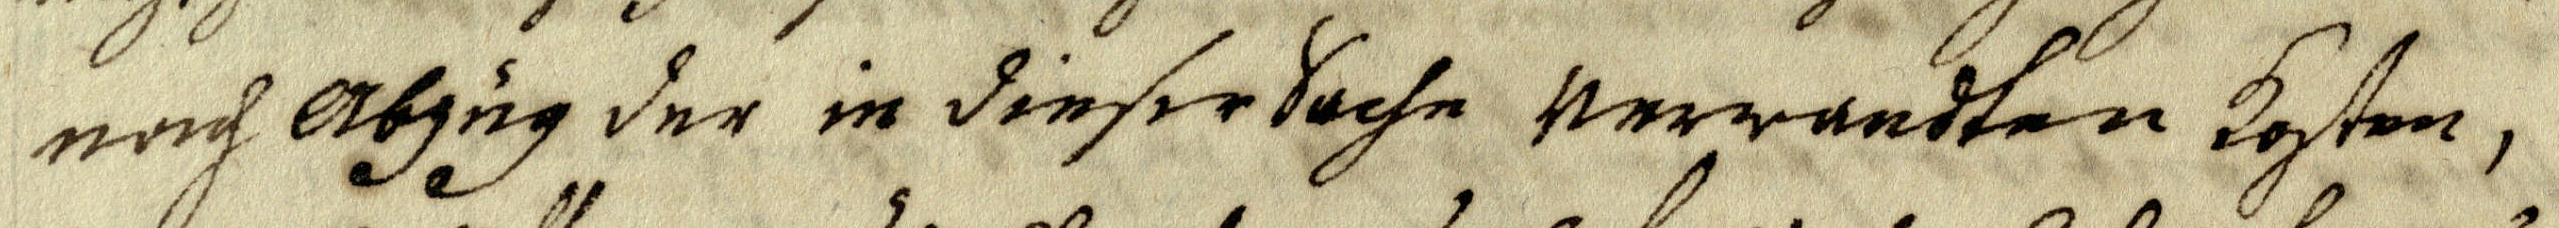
nach Abzug der in dieser Sache verwandten Kosten,
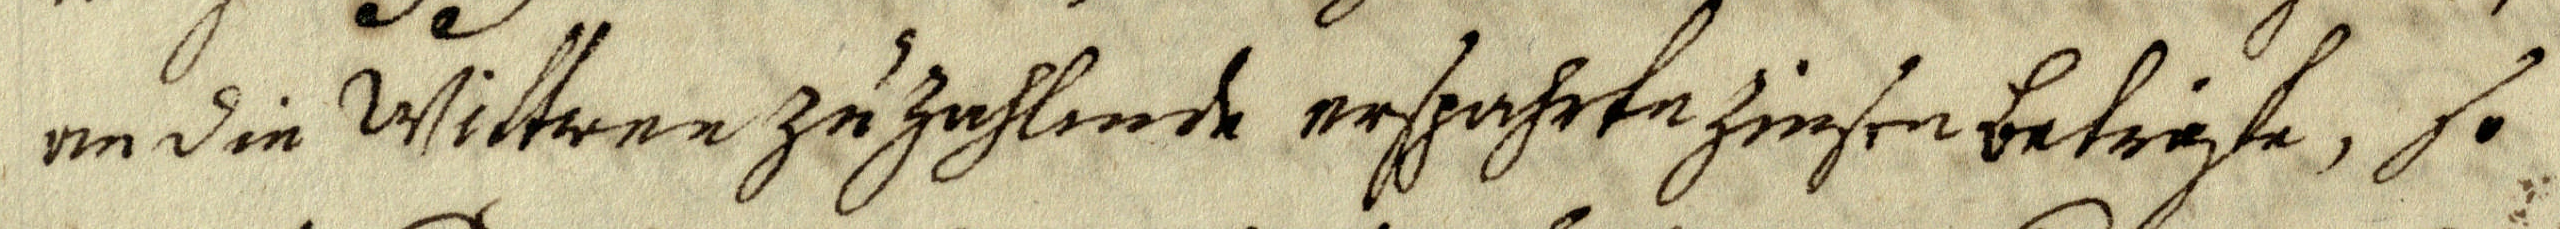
an die Wittwen zu zahlende erspahrte Zinsen beträfe, so
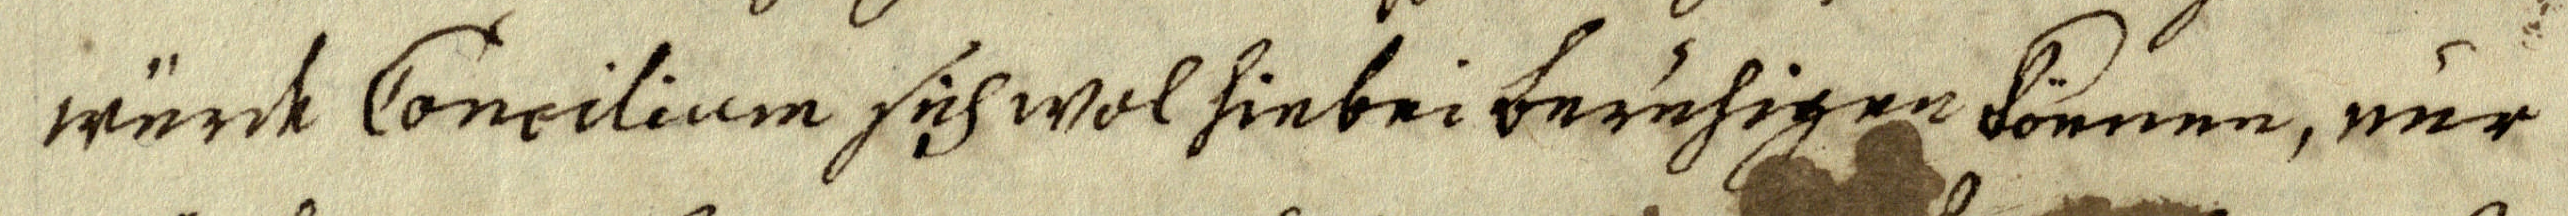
würde Concilium sich wol hiebei beruhigen können, nur
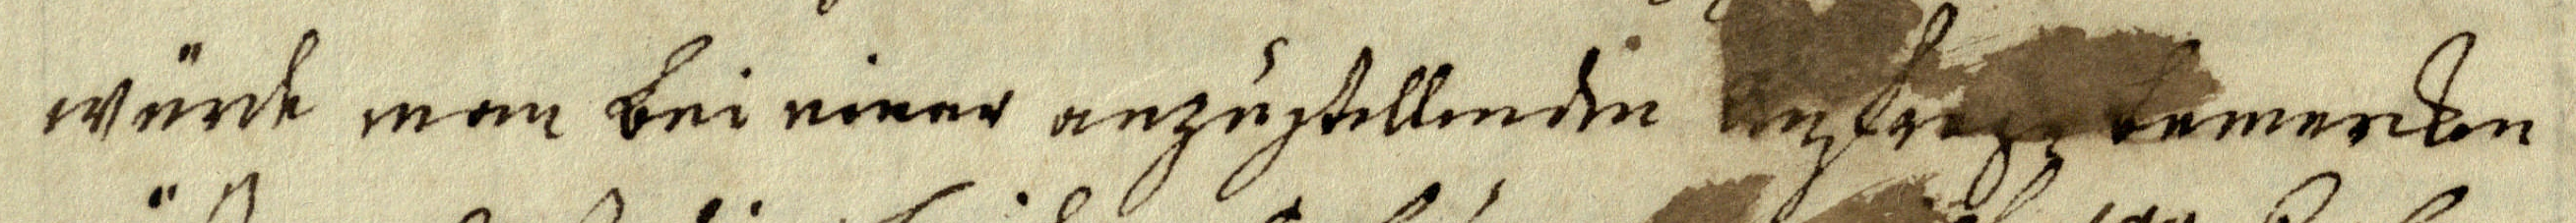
würde man bei einer anzustellenden Anfrage bemercken
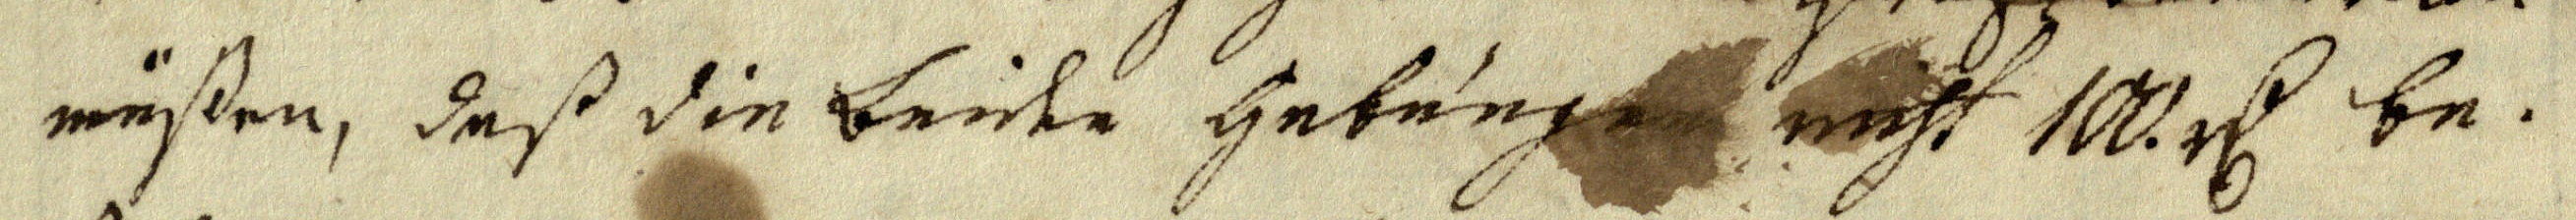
müßen, daß die beiden Hebungen nicht 100. rl. be¬
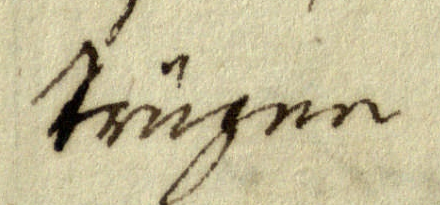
trügen.
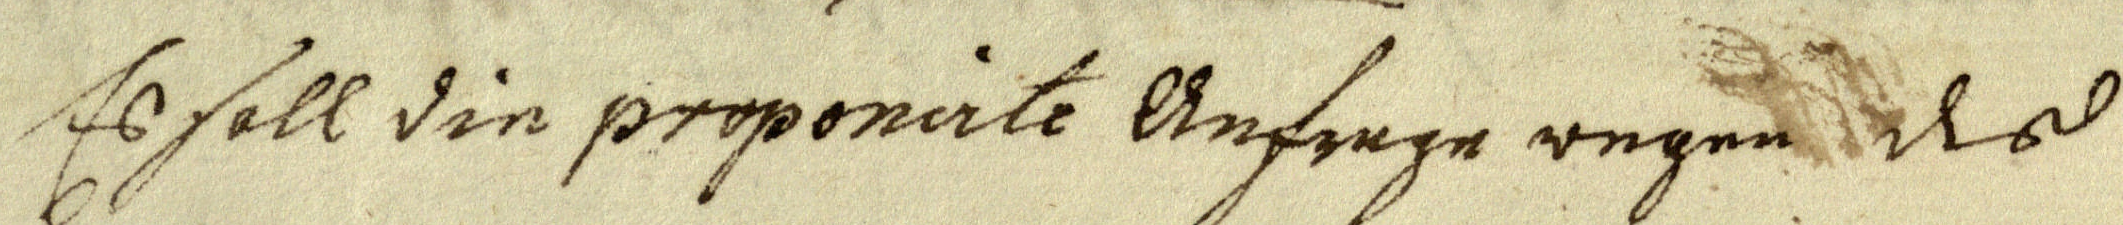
Es soll die proponirte Anfrage wegen des
